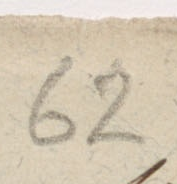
193.
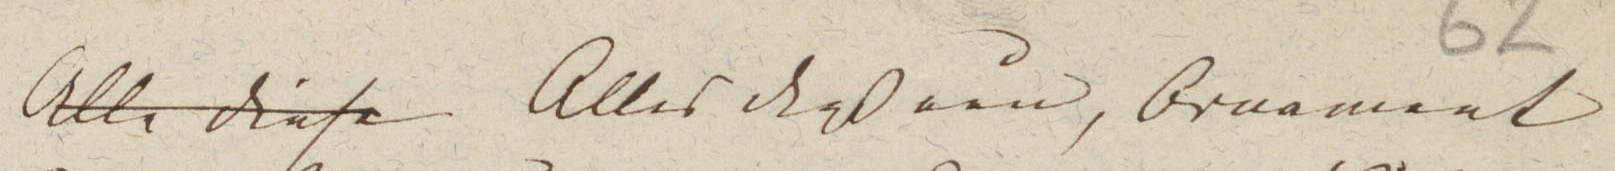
Alle diese Alles das nun, Ornament
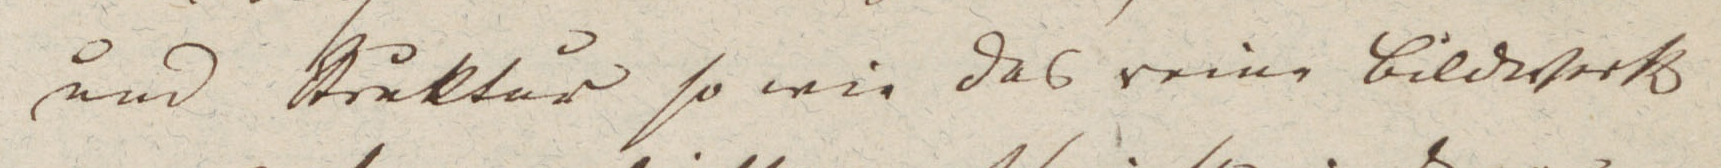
und Struktur so wie das reine Bildwerk
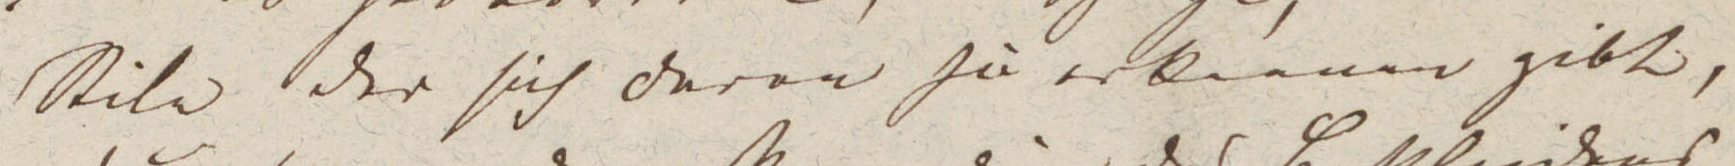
Stile der sich daran zu erkennen gibt,
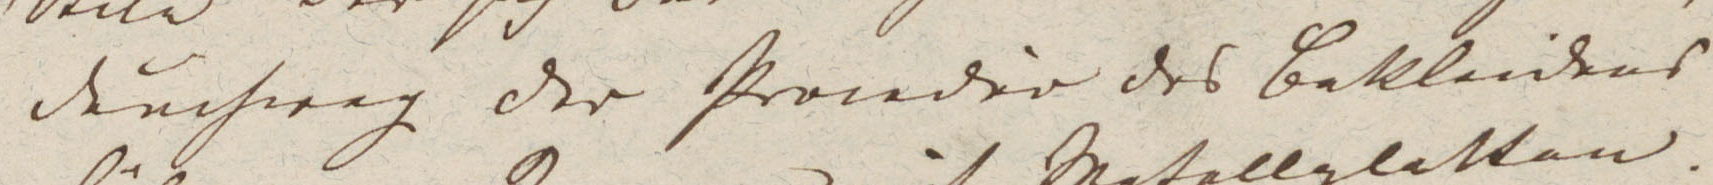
durchweg der Procedur des Bekleidens
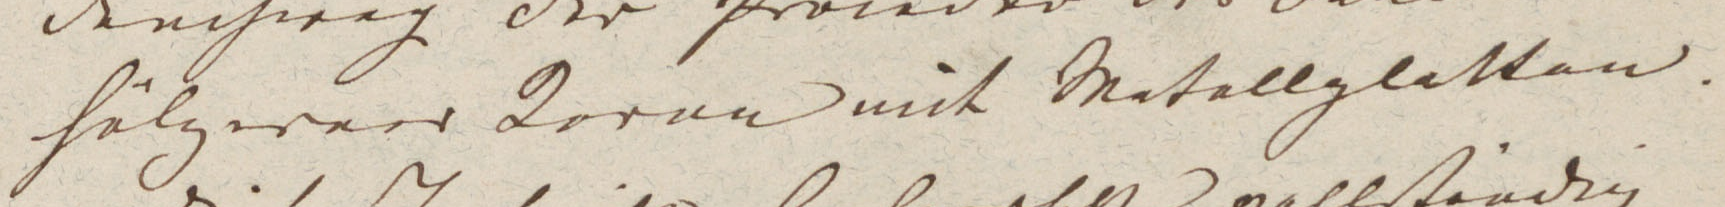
hölzerner Kerne mit Metallplatten.
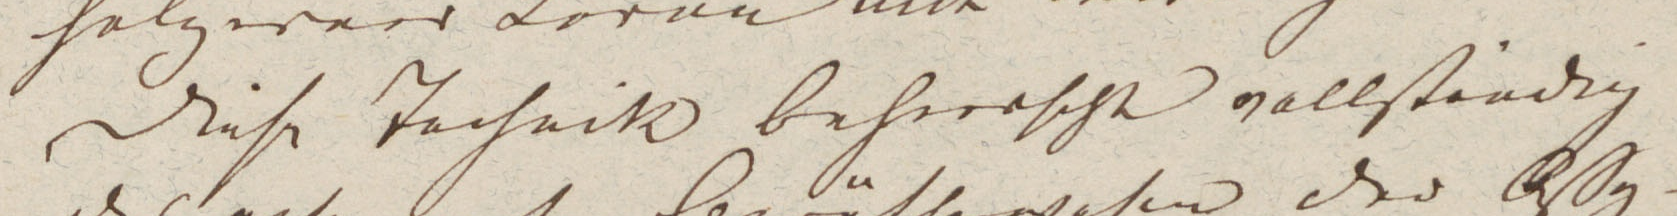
Diese Technik beherrscht vollständig
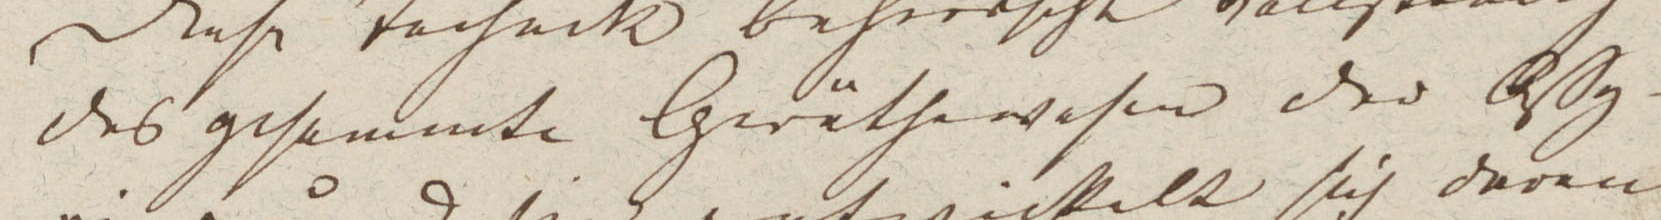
das gesammte Geräthewesen der Assy-
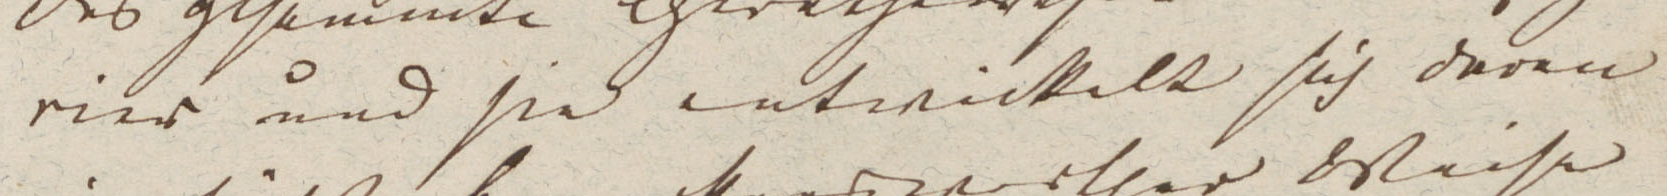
rier und sie entwickelt sich daran
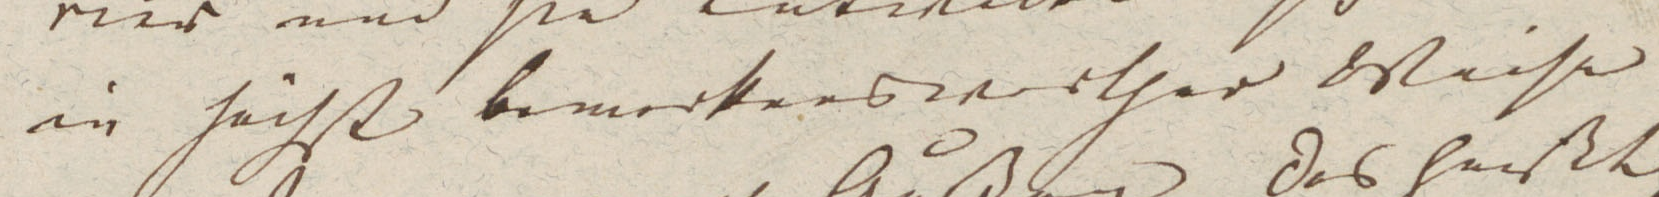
in höchst bemerkenswerther Weise
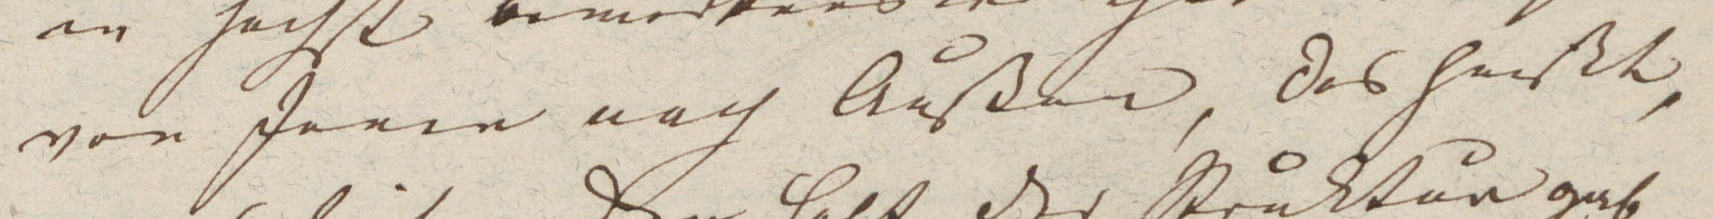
von Innen nach Aussen, das heisst,
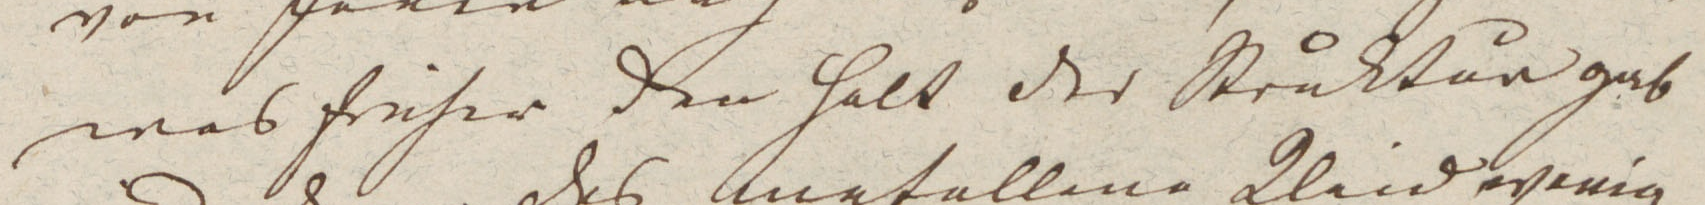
was früher den Halt der Struktur gab
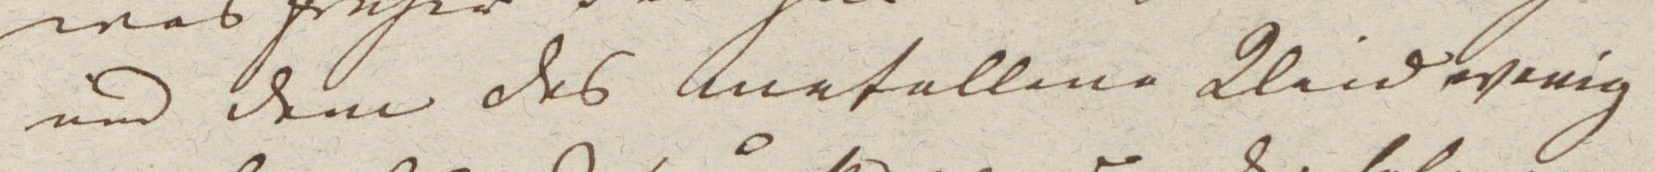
und dem das metallene Kleid wenig
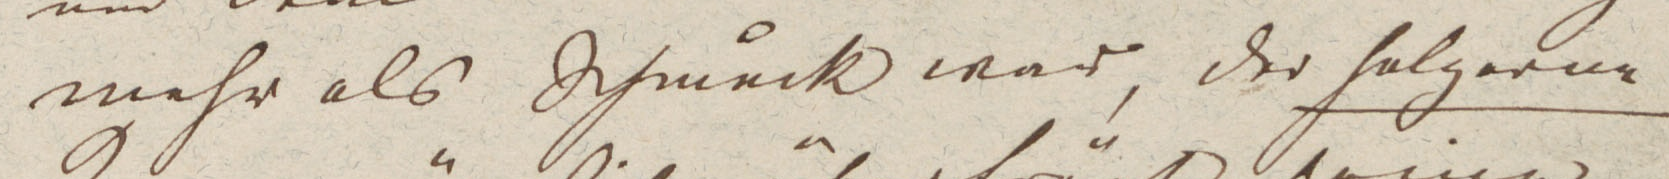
mehr als Schmuck war, der holzerne
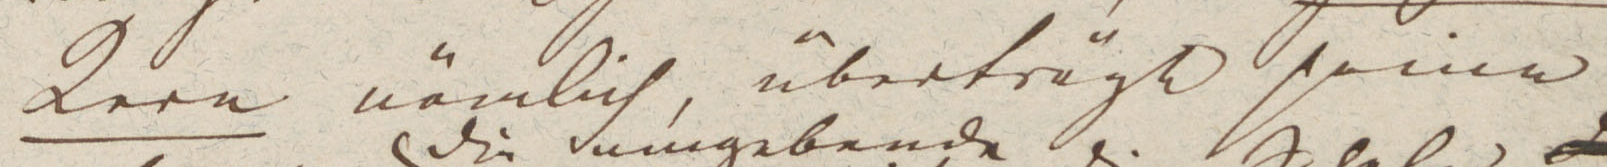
Kern nämlich, überträgt seine
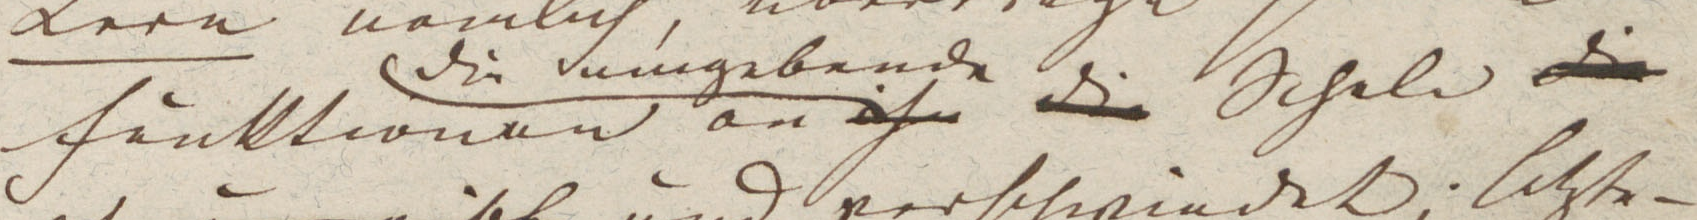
Funktionen an ihn die umgebende die Schale die
